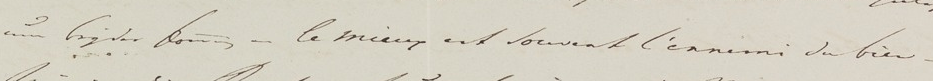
um beydes kommen – le mieux est souvent l'ennemi du bien. –
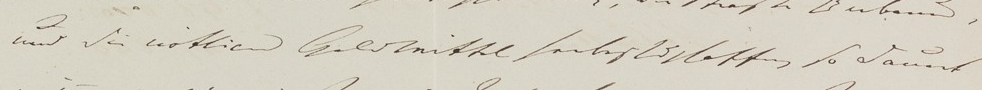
und die nöthigen Geldmittel herbeyzuschaffen, so dauert
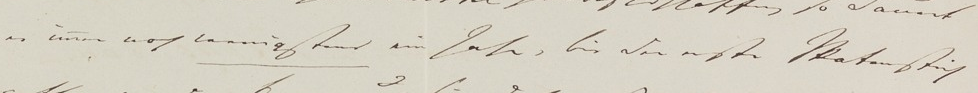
es immer noch wenigstens ein Jahr, bis der erste Spatenstich
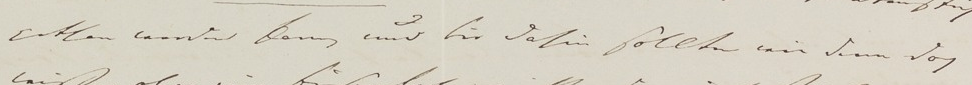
gethan werden kann, und bis dahin sollten wir denn doch
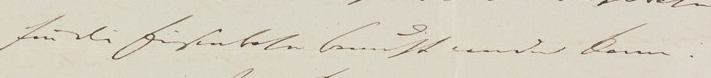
für die Eisenbahn benutzt werden kann.
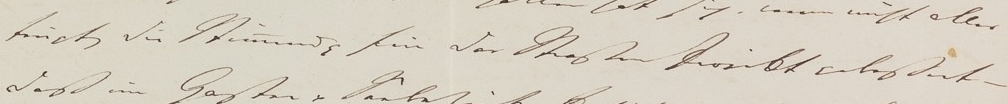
trügt, die Stimmung für das Straßen Projekt gebessert -
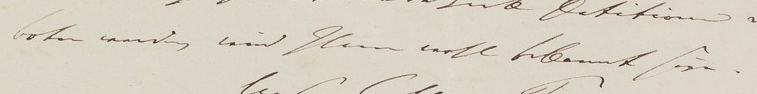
boten werden, wird Ihnen wohl bekannt sein.
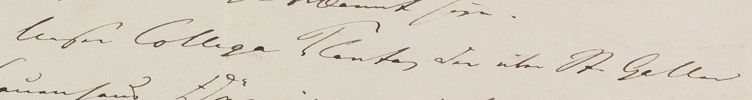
Unser Collega Planta, der über St. Gallen
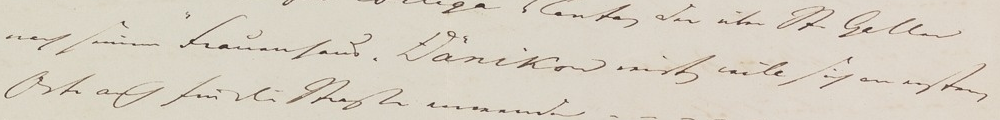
nach seinem «Frauenhaus» Dänikon reist, will sich am ersten
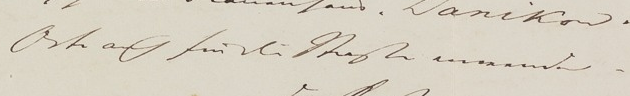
Orte auch für die Straße verwenden. – – – – –
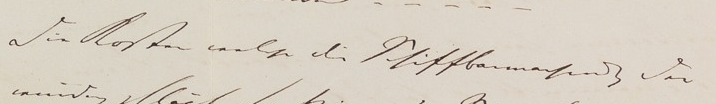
Die Kosten welche die Schiffbarmachung der
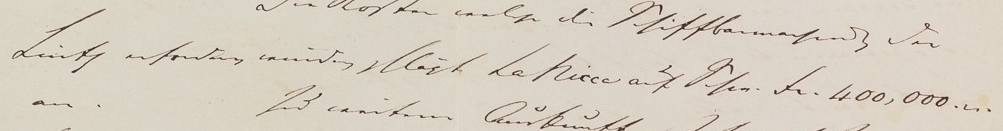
Linth erfordern würden, schlägt La Nicca auf Fr. 400,000.–
